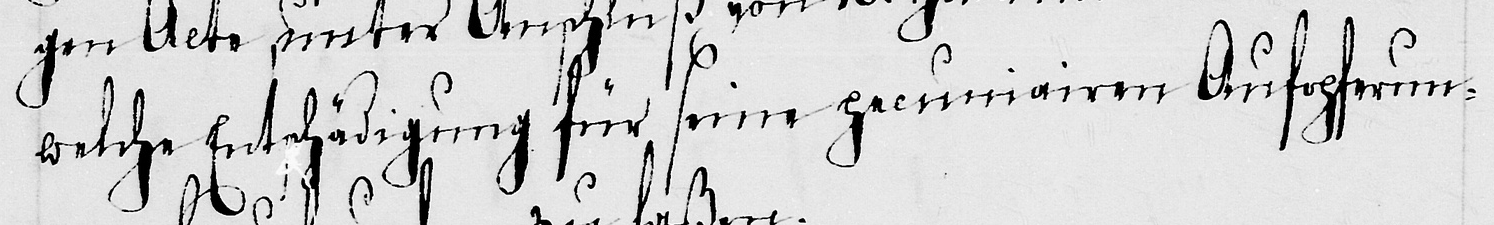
welche Entschädigung für seine pecuniairen Aufopferun¬
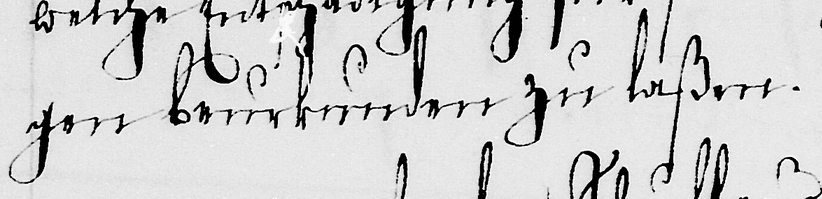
gen beurkunden zu laßen.
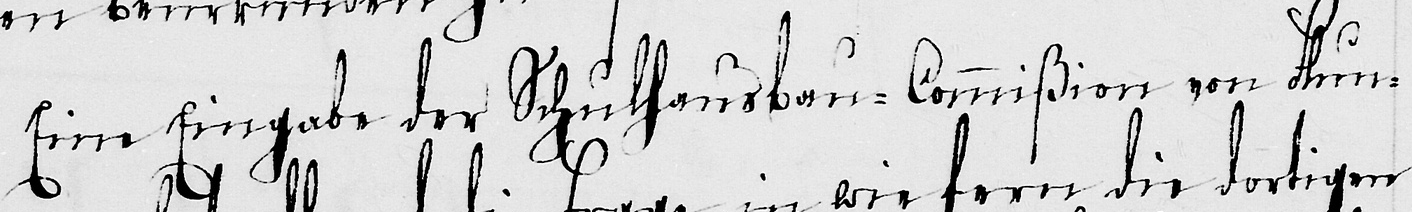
Eine Eingabe der Schulhausbau-Commißion von Flun¬
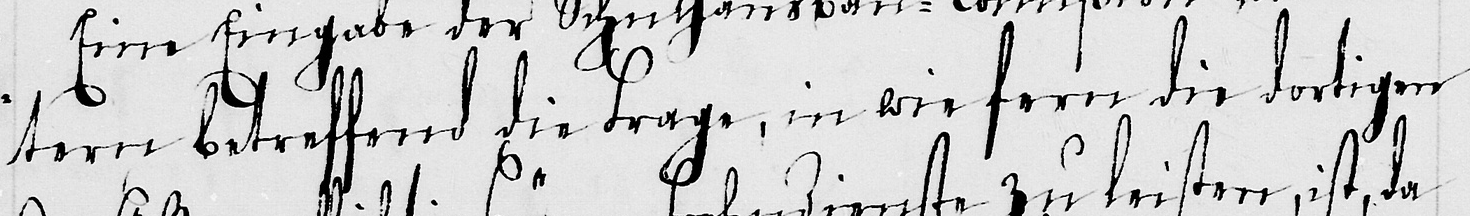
tern betreffend die Frage, in wiefern die dortigen
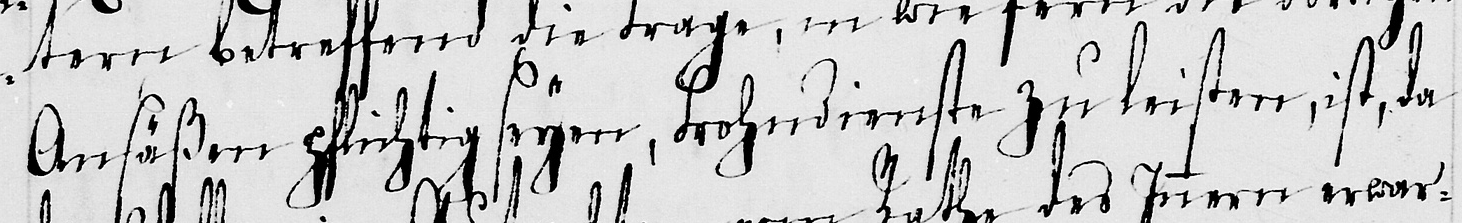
Ansäßen pflichtig seyen, Frohndienste zu leisten, ist, da
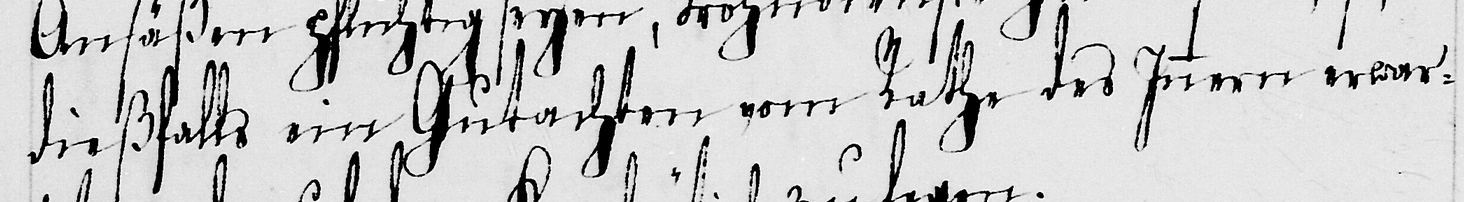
dießfalls ein Gutachten vom Rathe des Innern erwar¬
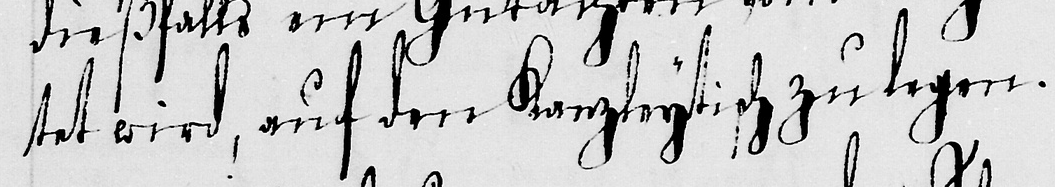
tet wird, auf den Kanzleytisch zu legen.
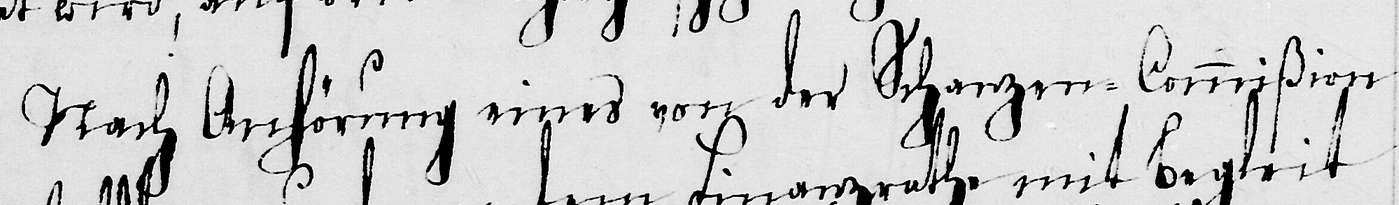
Nach Anhörung eines von der Schanzen-Commißion
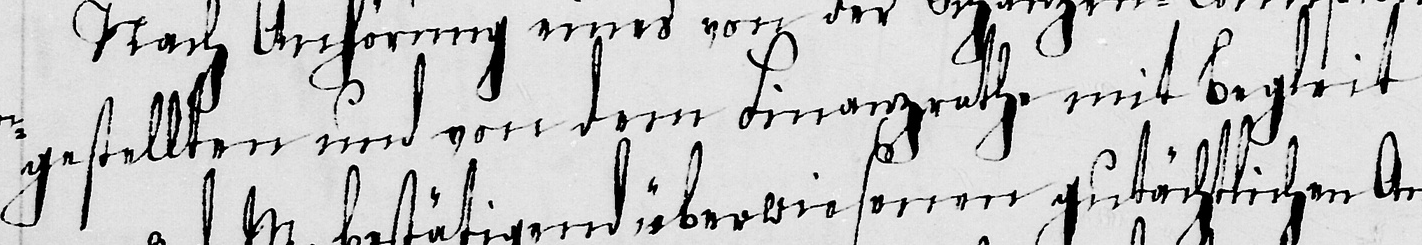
gestellten und von dem Finanzrathe mit Begleit
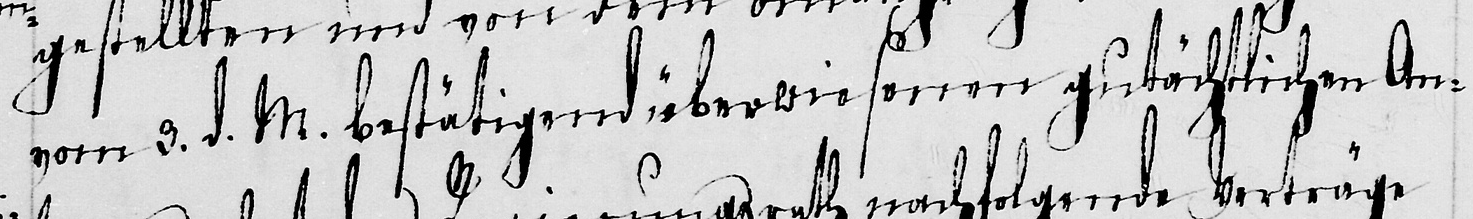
vom 3. d. M. bestätigend überwiesenen gutächtlichen An¬
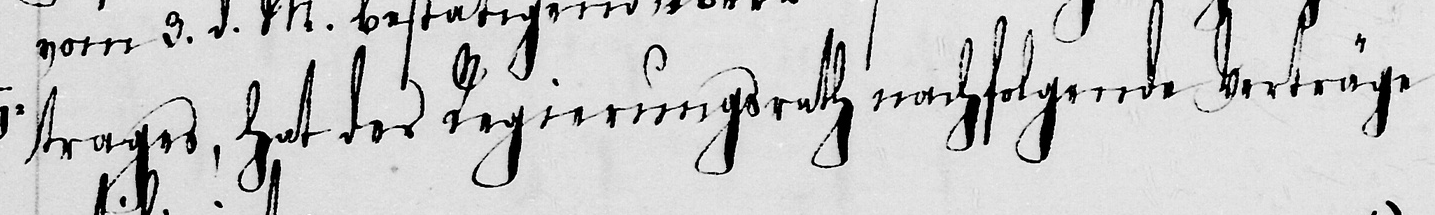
trages, hat der Regierungsrath nachfolgende Verträge
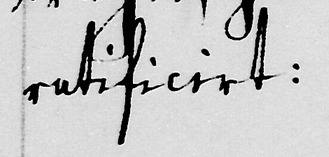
ratificirt:
